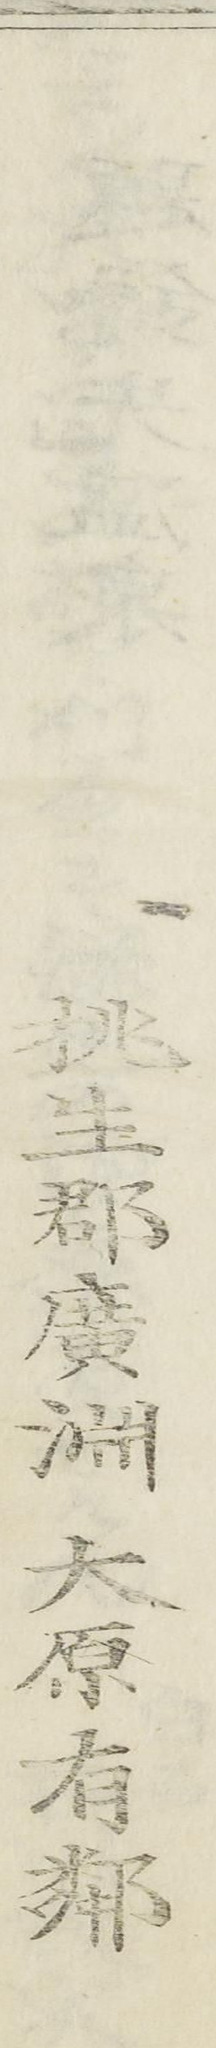桃尾郡広淵大原有鄰

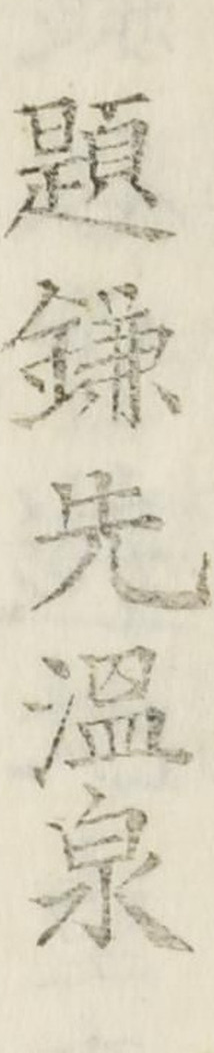題鎌先温泉
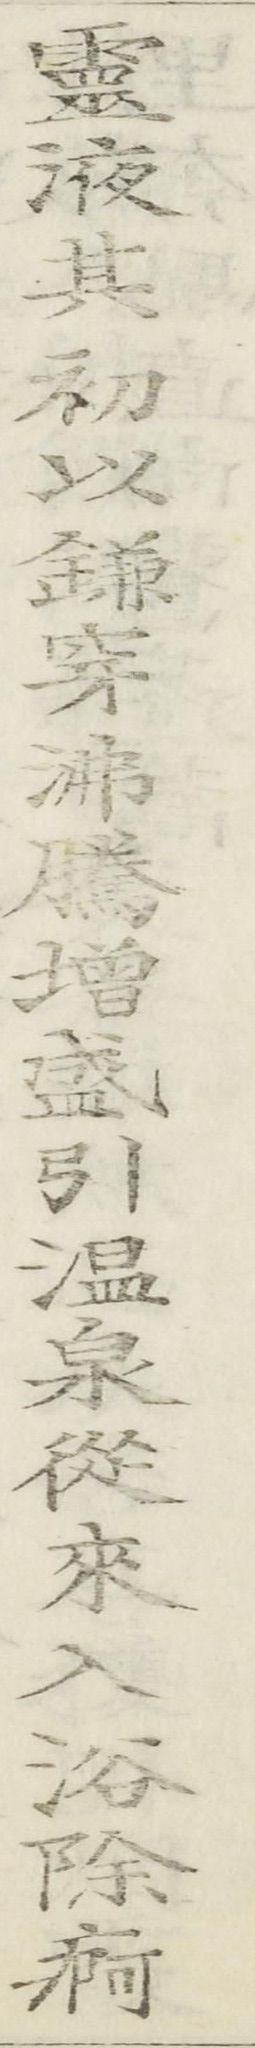霊液其初以鎌穿沸騰増盛引温泉従来入浴除痾
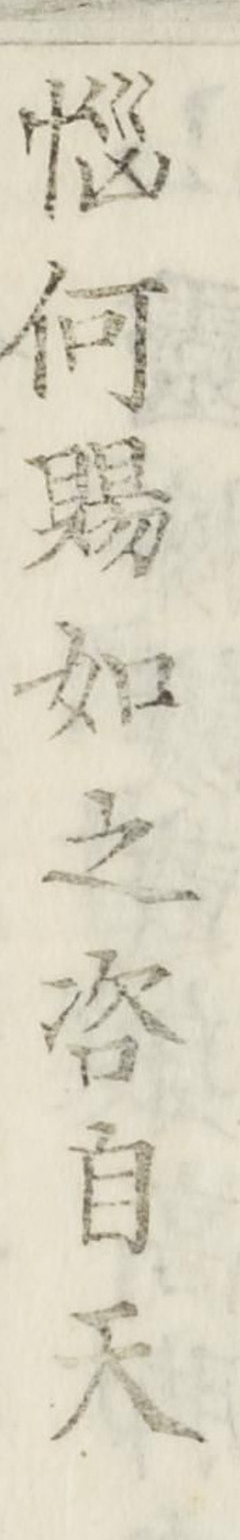悩何賜如之咨自天
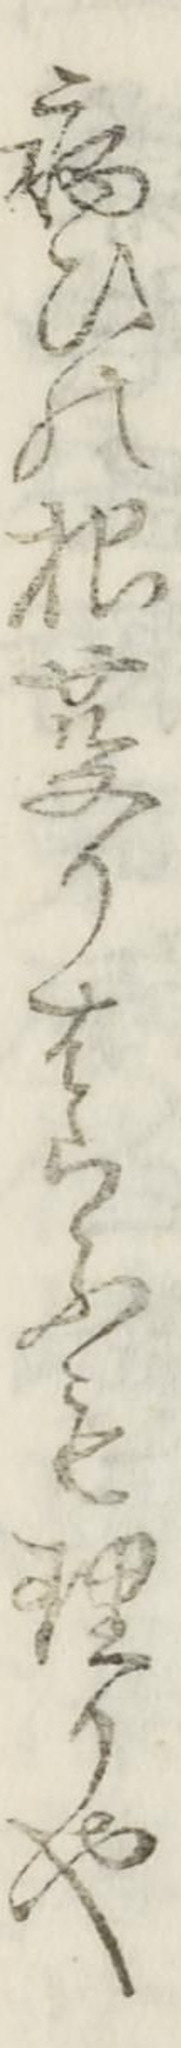病ひの根芟りはらふも理り也
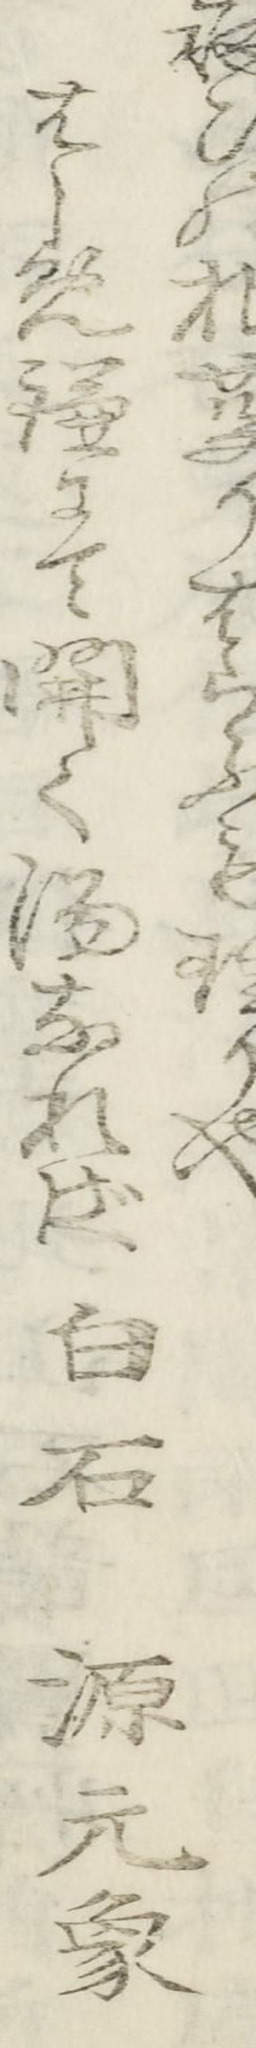はしめ鎌にて開く湯なれば白石源元象
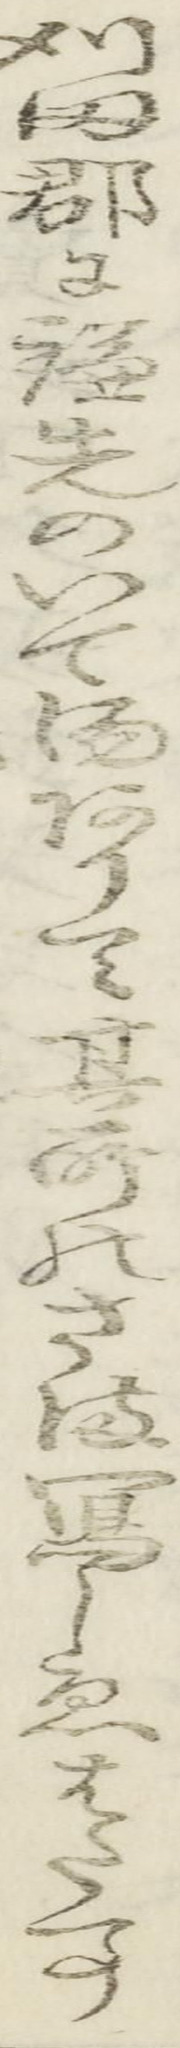刈田郡に鎌先のいて湯ありて其所のさま写しゑはた事
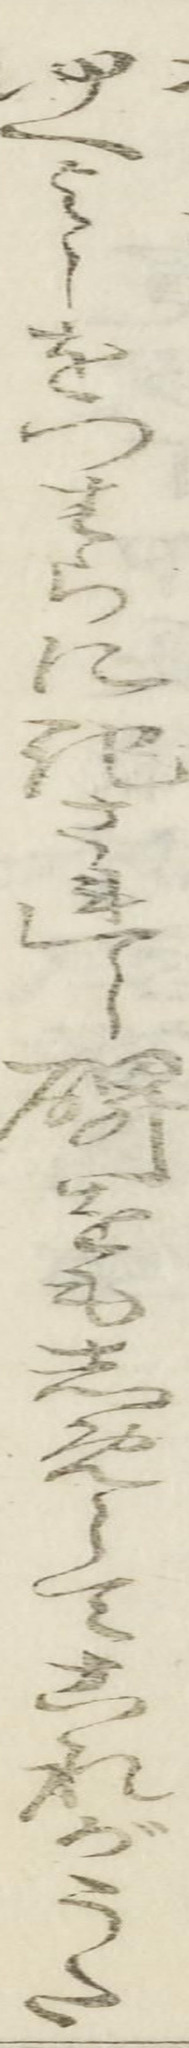ゆへみしをつはらに記されし碑をもしめしてこれがうた
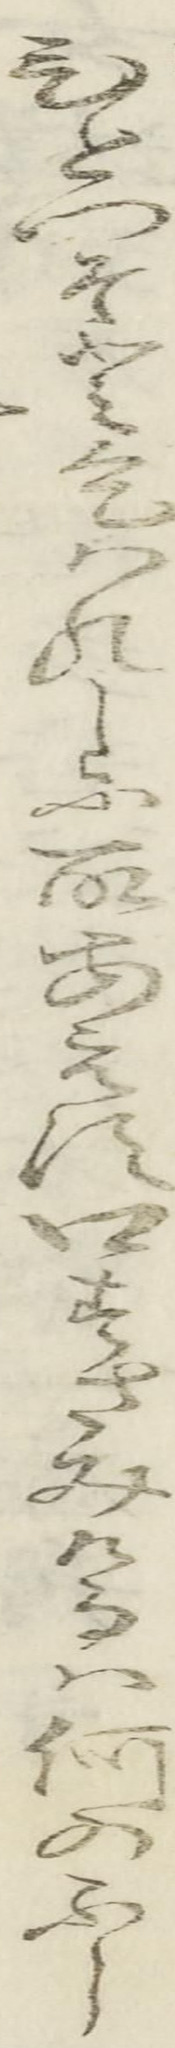ひとつそと乞はれしに取あえす口すさみけるは何のふし
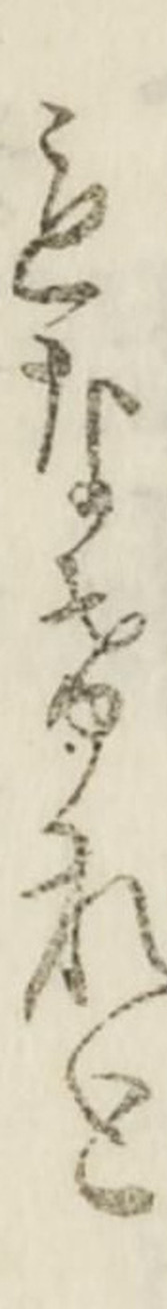もなけれと
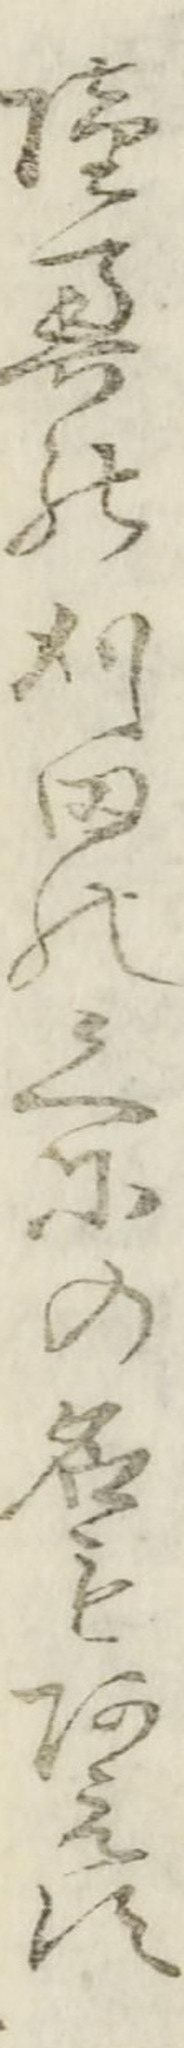陸奥の刈田のくにの名もあえす
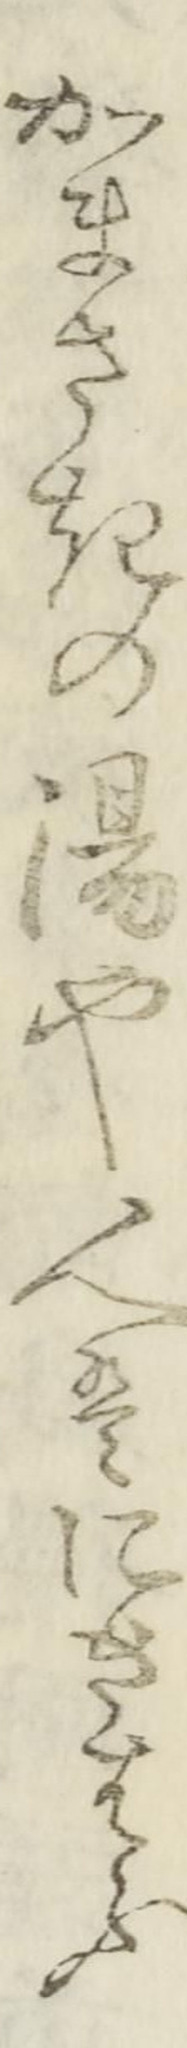かまさきの湯や人とにきはふ
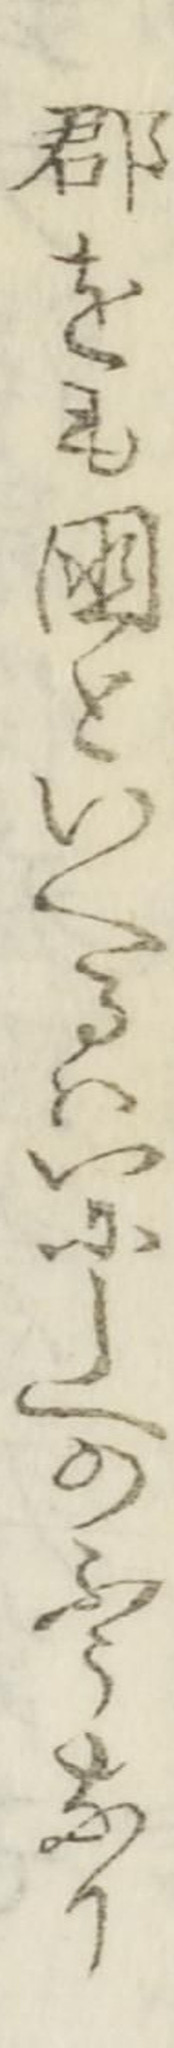郡をも国といへるはいにしへのふうなり
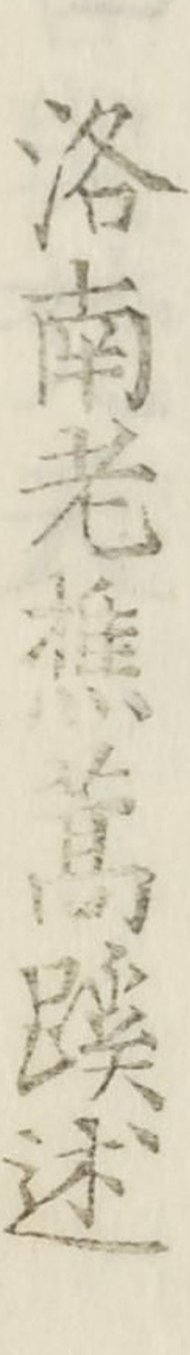洛南老樵蒿蹊述
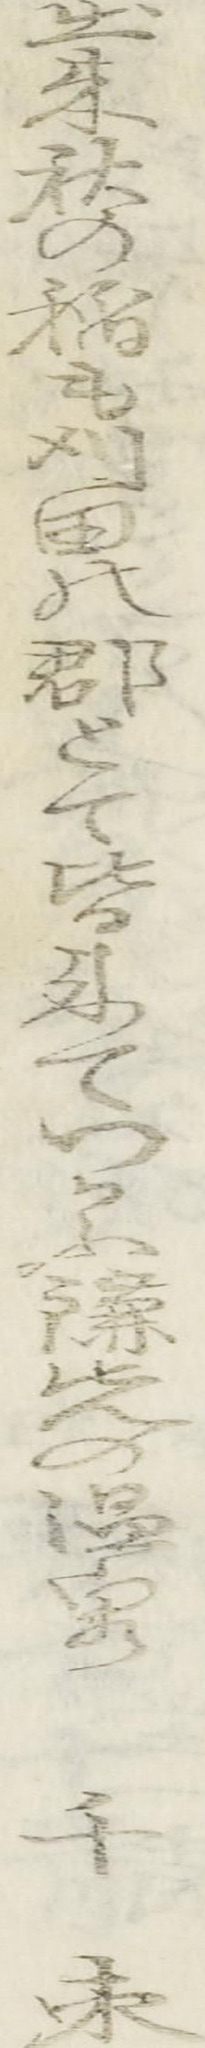出来秋の稲も刈田の郡とて皆来てつかふ鎌先の温泉東京千束
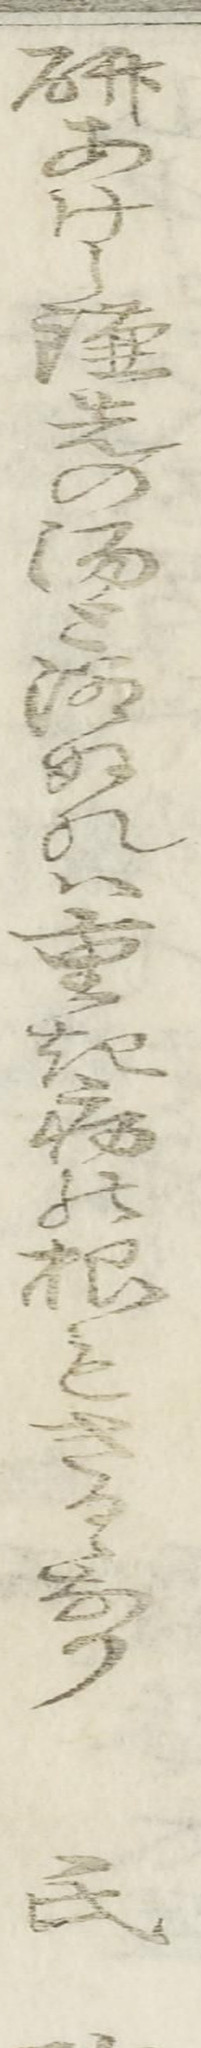研あけし鎌先の湯とあぬれは重き病の根もきるゝなり氏弥
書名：鎌先温泉由來記
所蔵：東京大学地震研究所図書室 Earthquake Research Institute Library, The University of Tokyo, JAPAN
